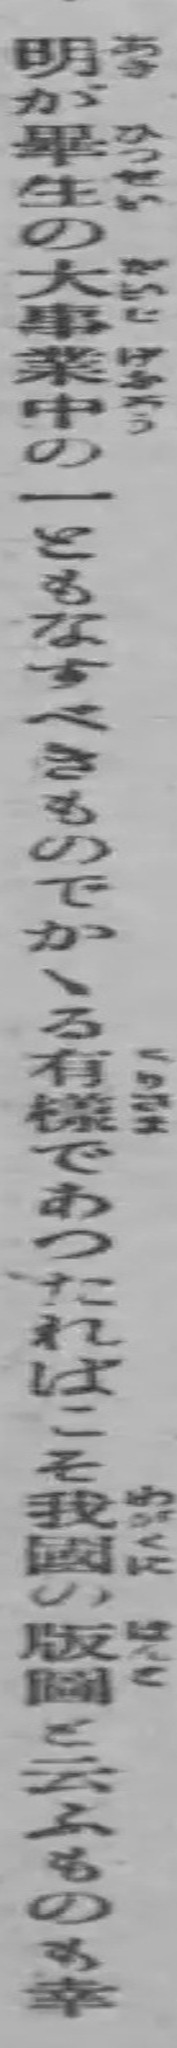明が畢生の大事業中の一ともなすべものでかゝる有様であつたればこそ我国の版図と云ふものも幸
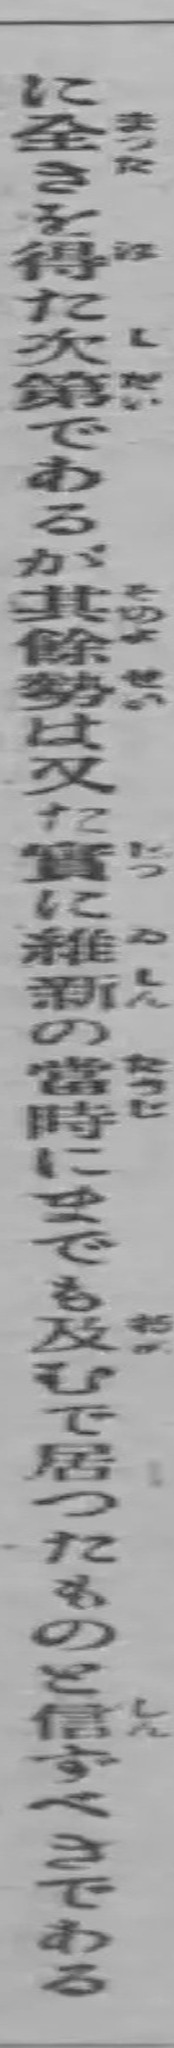に全きを得た次第であるが其余勢は又た実に維新の当時にまでも及むで居たものと信ずべきである
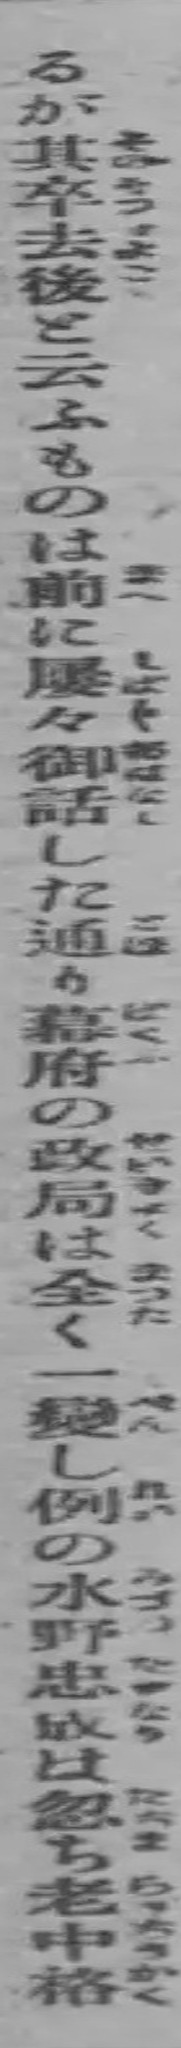るが其卒去後と云ふものは前に屡々御話した通り幕府の政局は全く一変し例の水野忠成は忽ち老中格

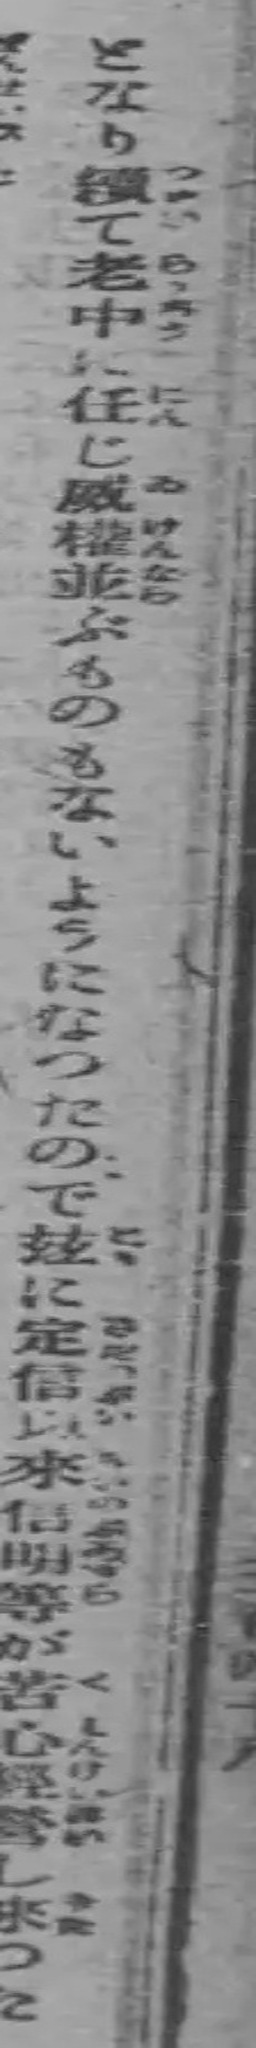となり続て老中に任じ威権並ぶものもないようになつたので茲に定信以来信明等が苦心経営し来つた
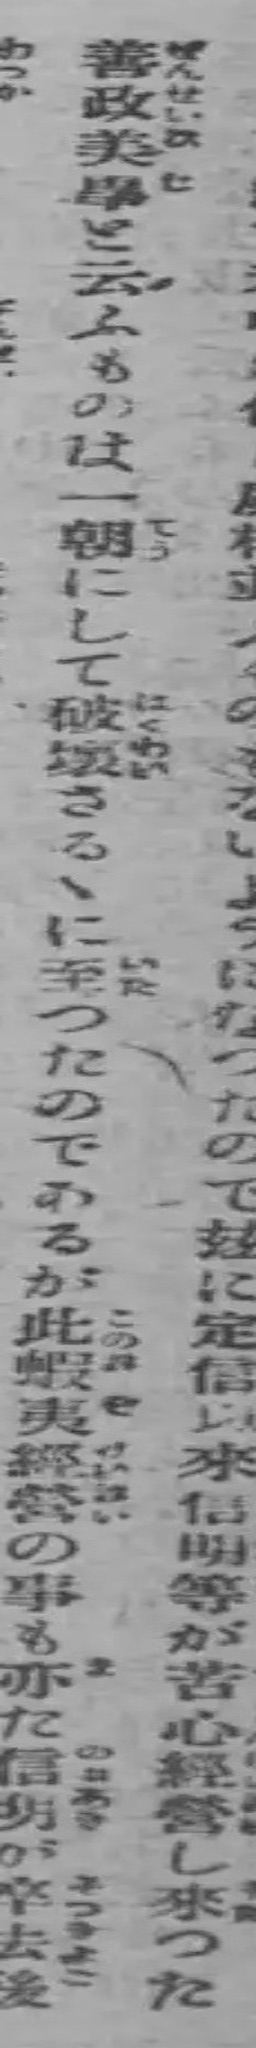善政美事と云ふものは一朝にして破壊さるゝに至つたのであるが此蝦夷経営の事も亦た信明が卒去後
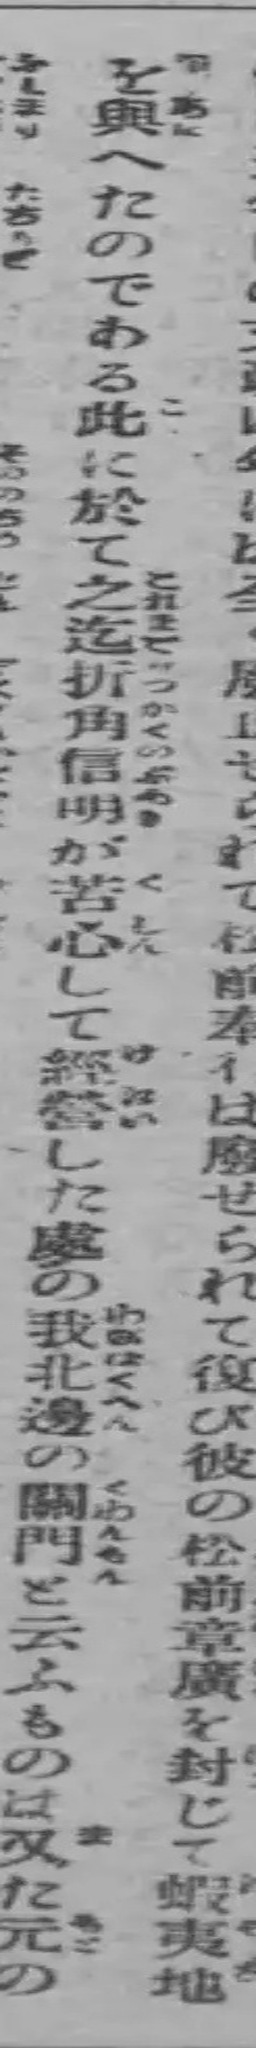を与へたのである此に於て之迄折角信明が苦心して経営した処の我北辺の関門と云ふものは又た元の
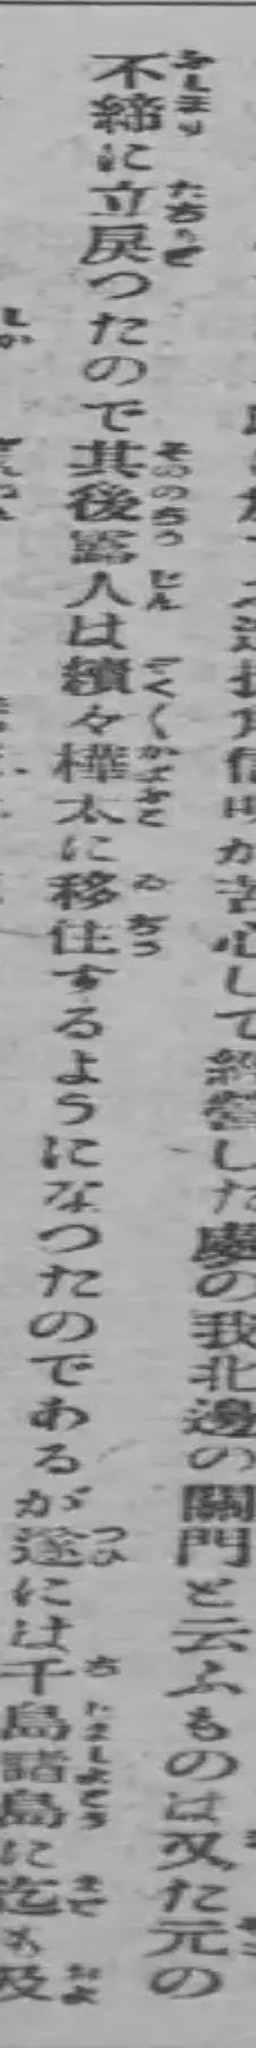不締に立戻つたので其後露人は続々樺太に移住するようになつたのであるが遂には千島諸島に迄も及
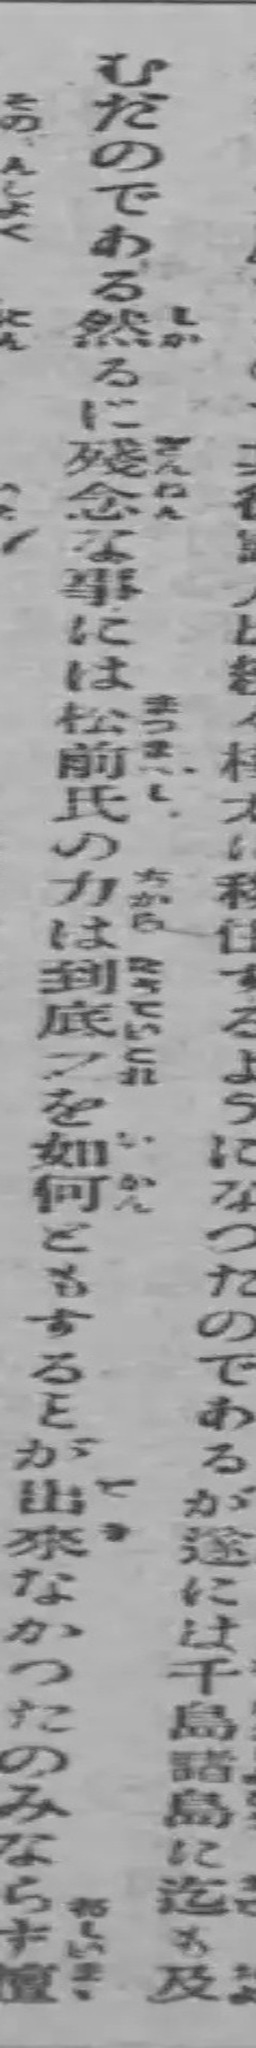むだのである然るに残念な事には松前氏の力は到底之を如何ともすることが出来なかつたのみならず擅
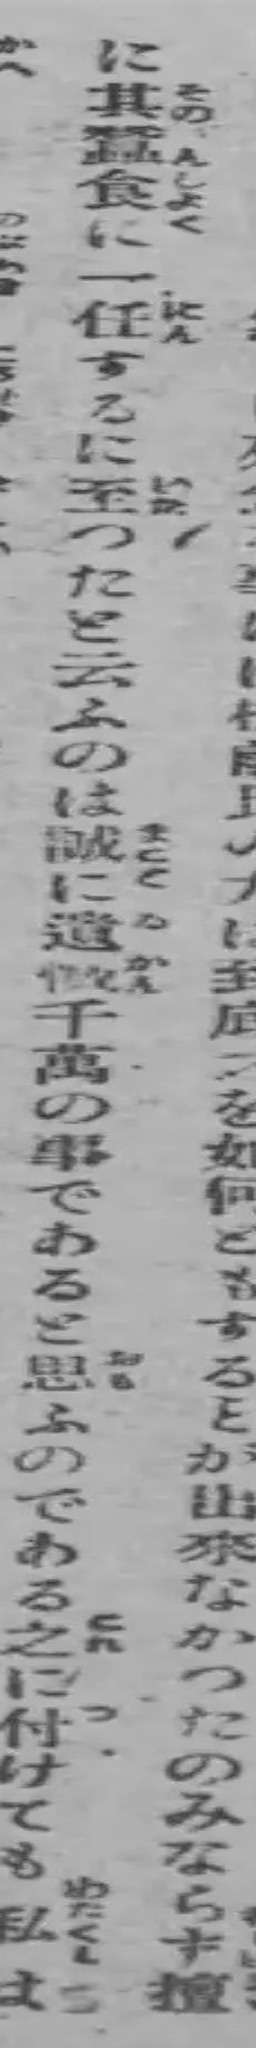に其蠺食に一任するに至つたと云ふのは誠に遺憾千万の事であると思ふのである之に付けても私は
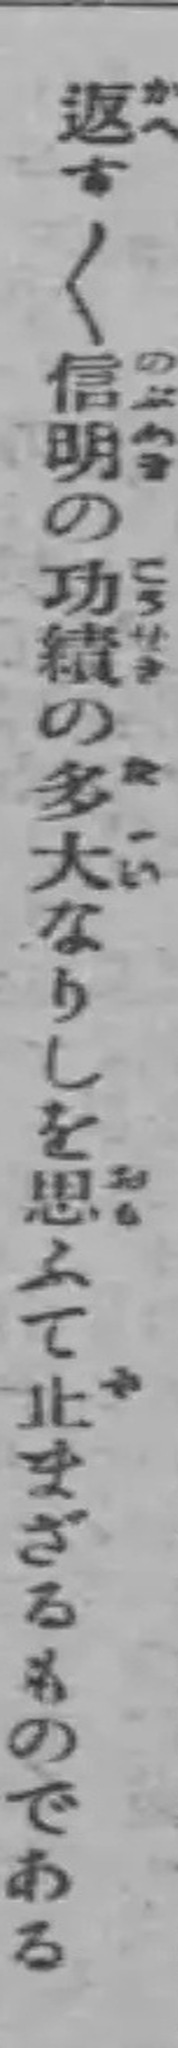返す〳〵信明の功績の多大なりしを思ふて止まざるものである
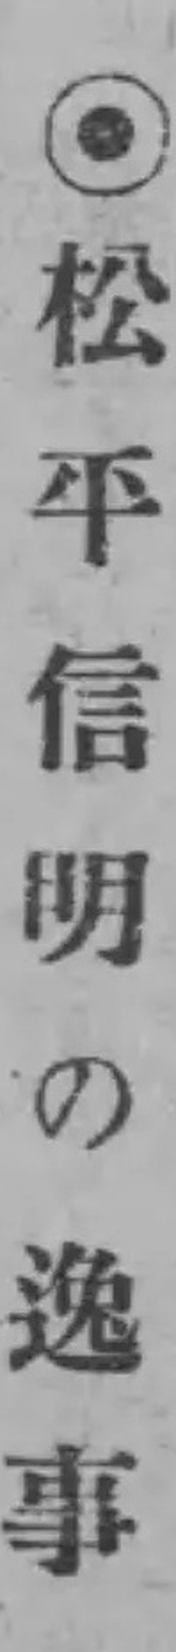⦿松平信明の逸事
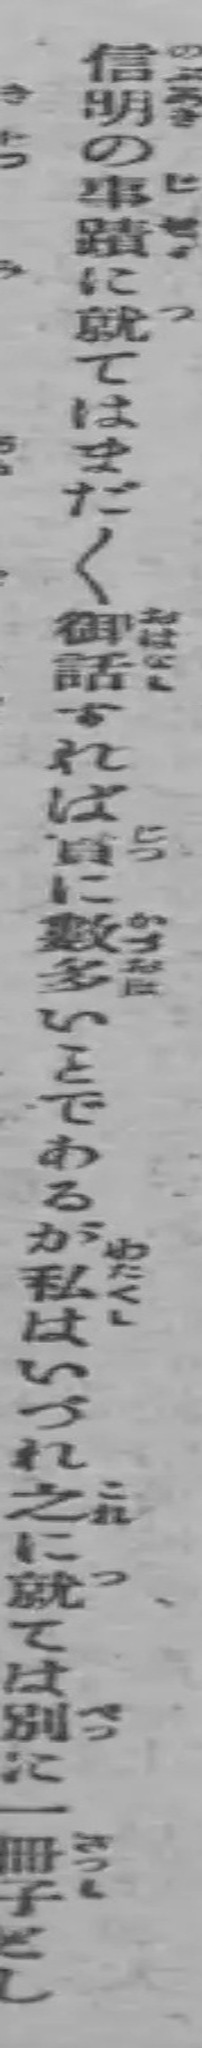信明の事蹟に就てはまだ〳〵御話すれば実に数多いことであるが私はいづれ之に就ては別に一冊子とし
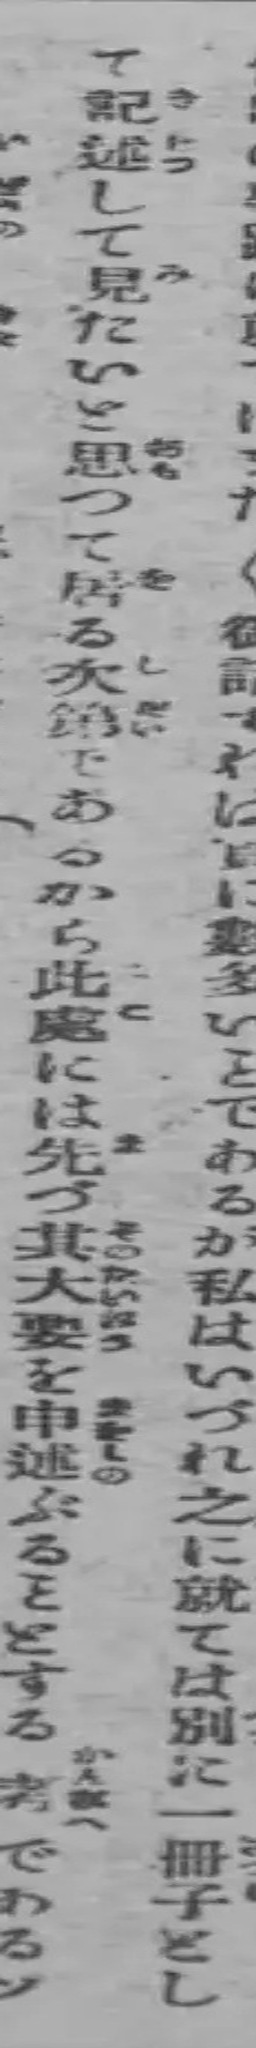て記述して見たいと思つて居る次第であるから此処には先づ其大要を申述ぶることとする考であるソ
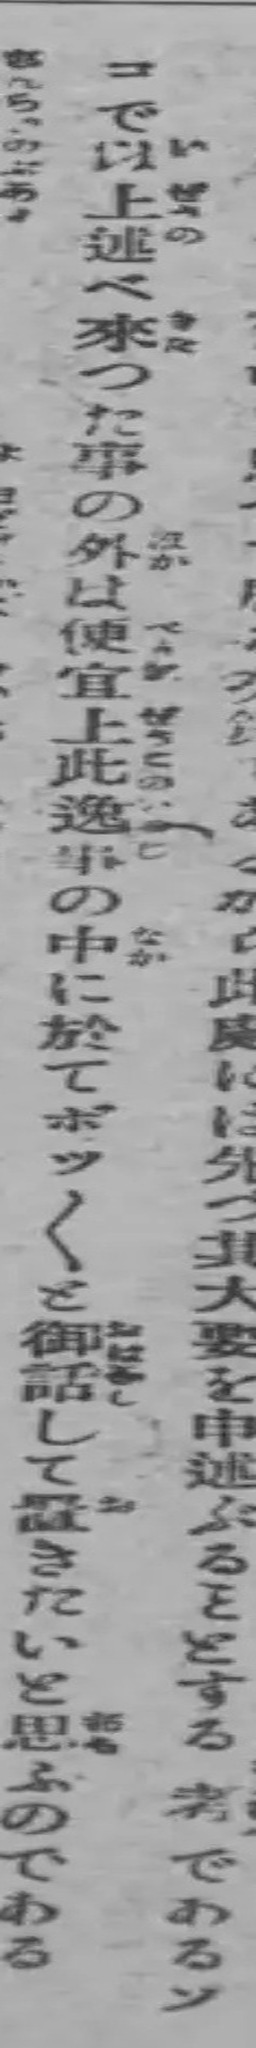コで以上述べ来つた事の外は便宜上此逸事の中に於てボツ〳〵と御話して置きたいと思ふのである
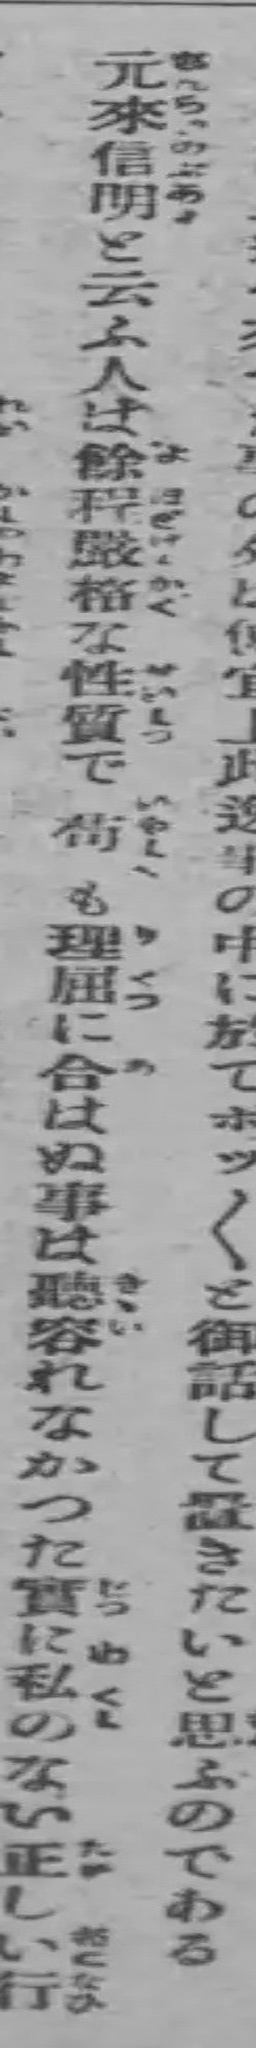元来信明と云ふ人は余程厳格な性質で苟も理屈に合はぬ事は聴容れなかつた実に私のない正しい行
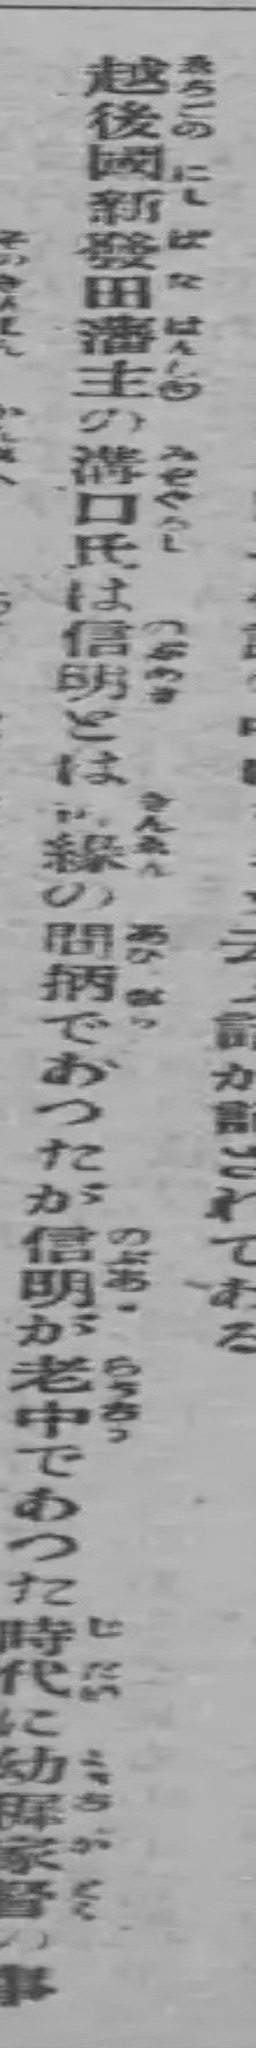越後国新発田藩主の溝口氏は信明とは近縁の間柄であつたが信明が老中であつた時代幼穉家督の事
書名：豊橋市史談
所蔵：国立国会図書館 National Diet Library, JAPAN
